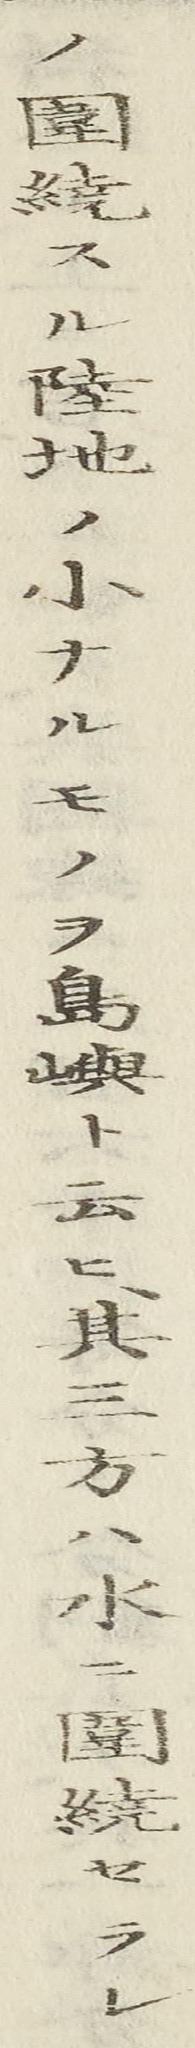ノ囲繞スル陸地ノ小ナルモノヲ島嶼ト云ヒ、其三方ハ水ニ囲繞セラレ
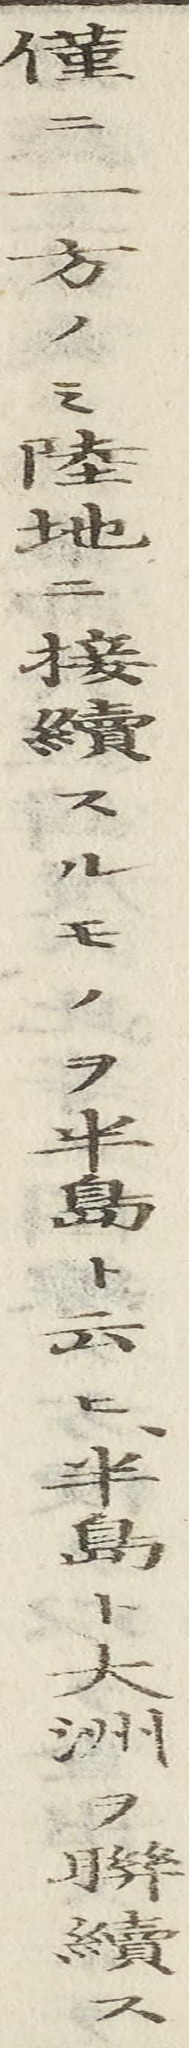僅ニ一方ノミ陸地ニ接続スルモノヲ半島ト云ヒ、半島ト大洲ノ連続ス
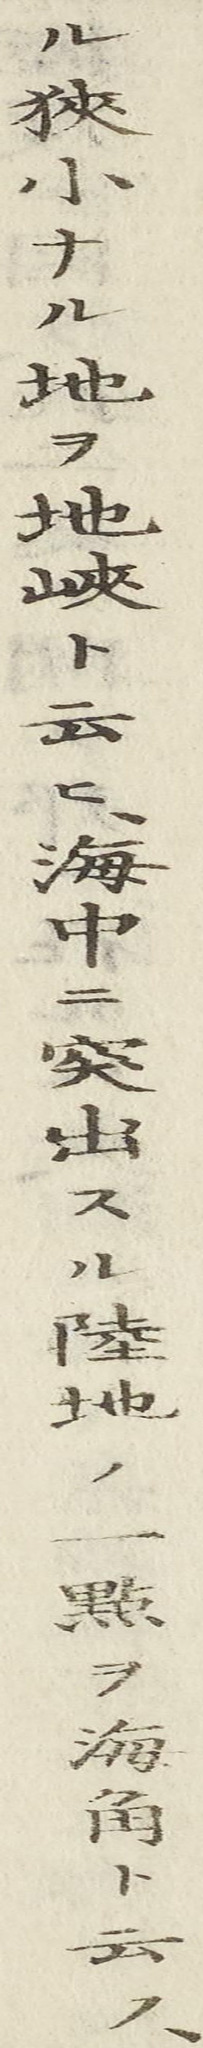ル狭小ナル地ヲ地峡ト云ヒ、海中ニ突出スル陸地ノ一点ヲ海角ト云フ、
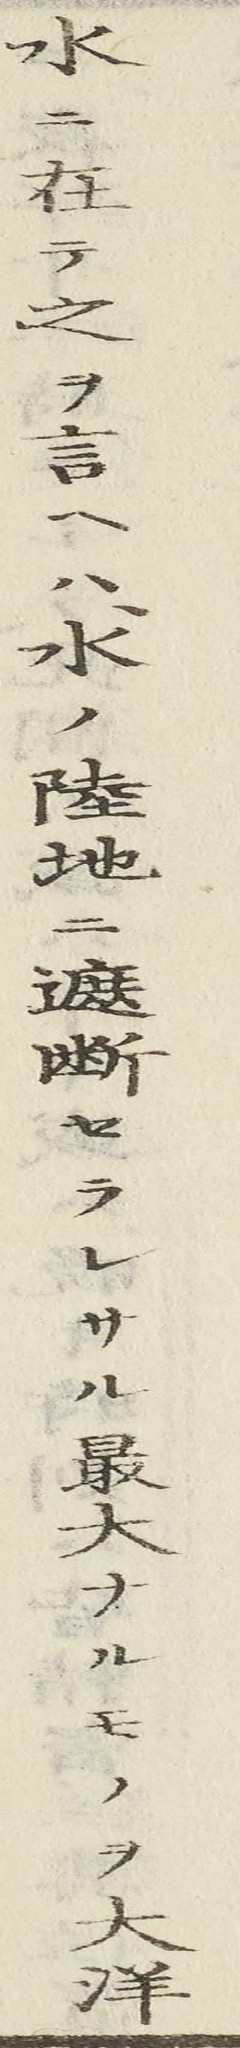水ニ在テ之ヲ言ヘハ、水ノ陸地ニ遮断セラレサル最大ナルモノヲ大洋
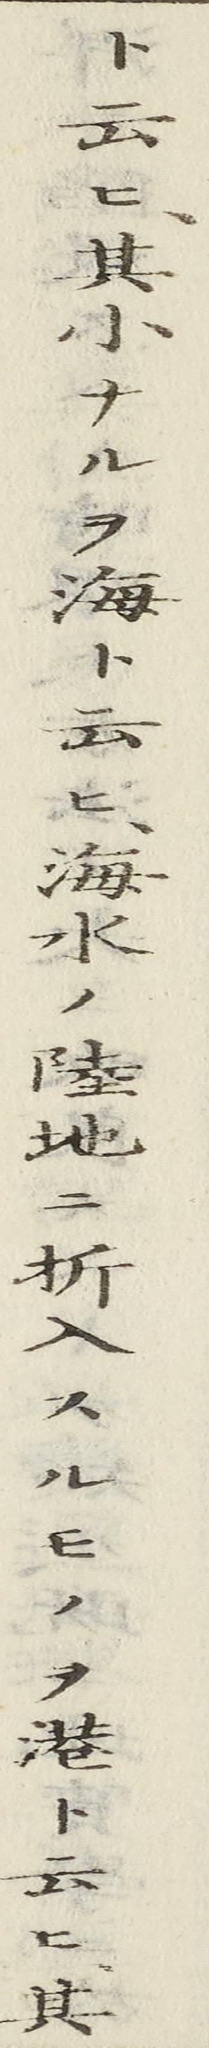ト云ヒ、其小ナルヲ海ト云ヒ、海水ノ陸地ニ折入スルモノヲ港ト云ヒ、其
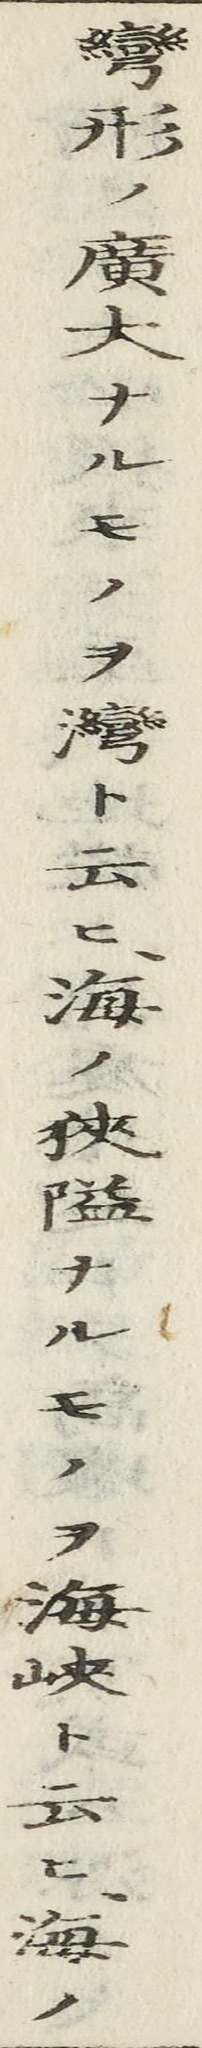彎形ノ広大ナルモノヲ湾ト云ヒ、海ノ狭隘ナルモノヲ海峡ト云ヒ、海ノ
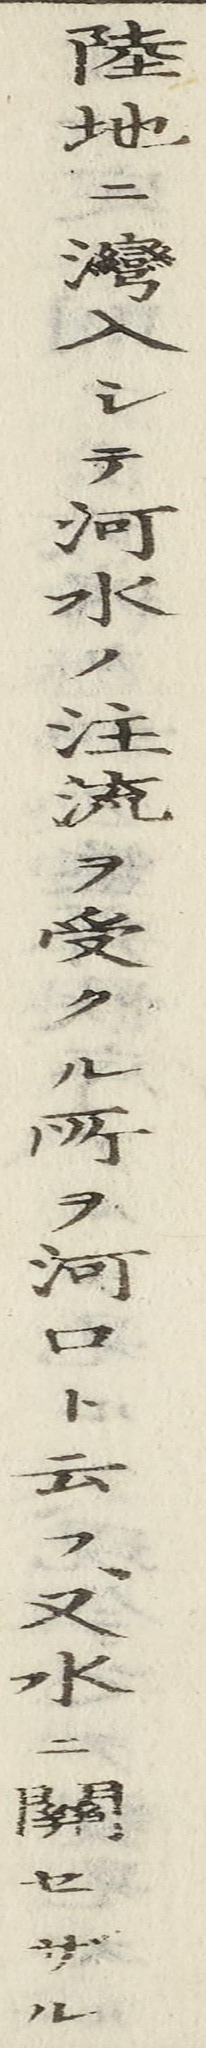陸地ニ湾入シテ河水ノ注流ヲ受クル所ヲ河口ト云フ、又水ニ関セサル
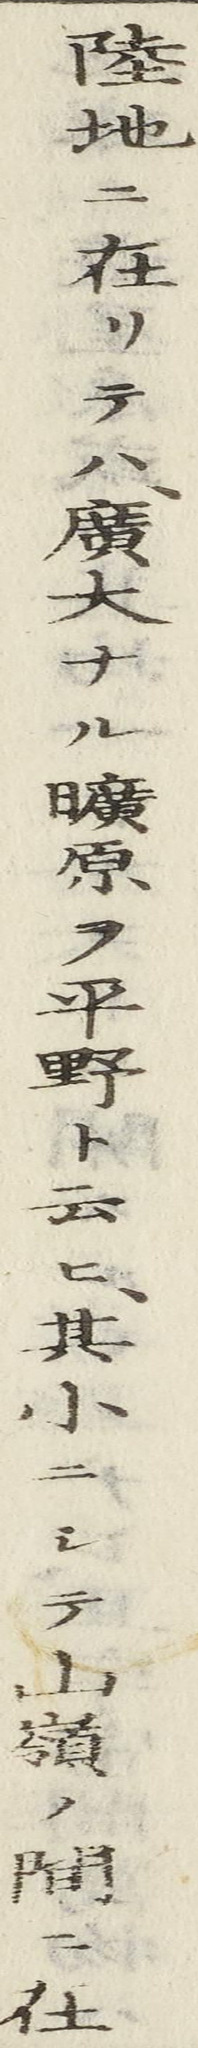陸地ニ在リテハ、広大ナル曠原ナル平野ト云ヒ、其小ニシテ山嶺ノ間ニ在
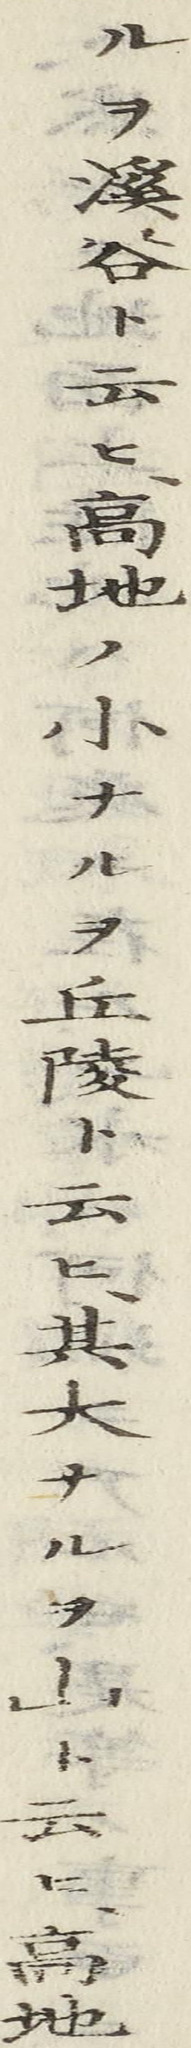ルヲ渓谷ト云ヒ、高地ノ小ナルヲ丘陵ト云ヒ、其大ナルヲ山ト云ヒ、高地
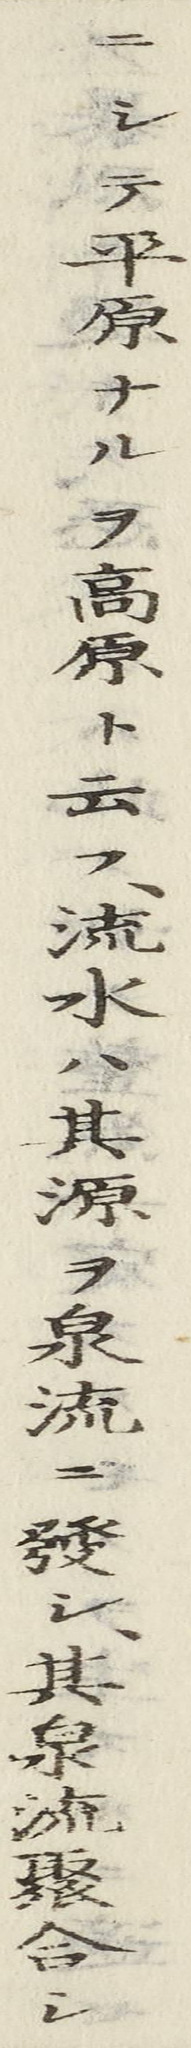ニシテ平原ナルヲ高原ト云フ、流水ハ其源ヲ泉流ニ発シ、其泉流聚合シ
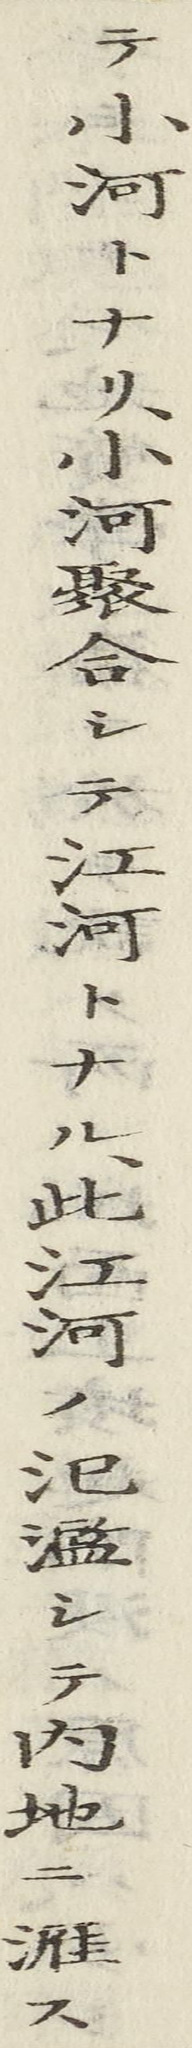テ小河トナリ、小河聚合シテ江河トナル、此江河ノ氾濫シテ内地ニ潅？ス
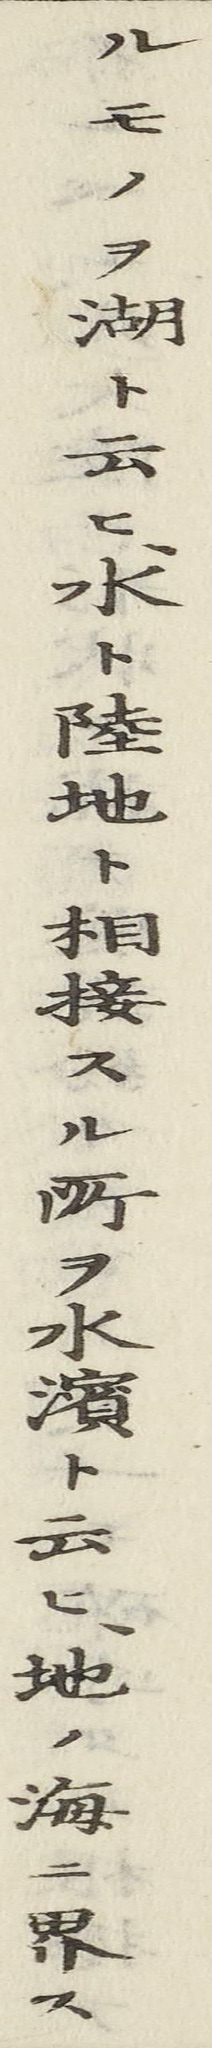ルモノヲ湖ト云ヒ、水ト陸地ト相接スル所ヲ水浜ト云ヒ、地ノ海ニ界ス
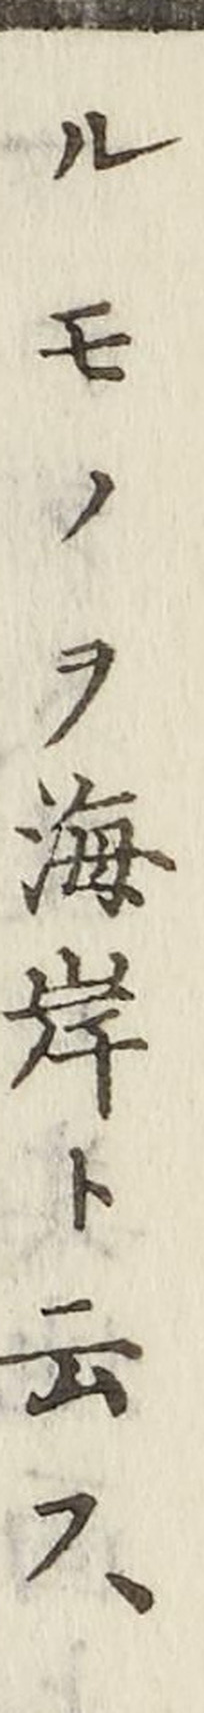ルモノヲ海岸ト云フ、
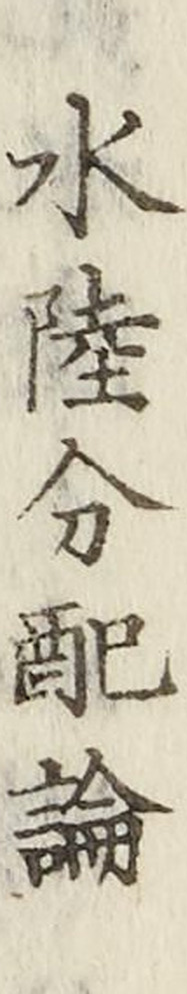水陸分配論
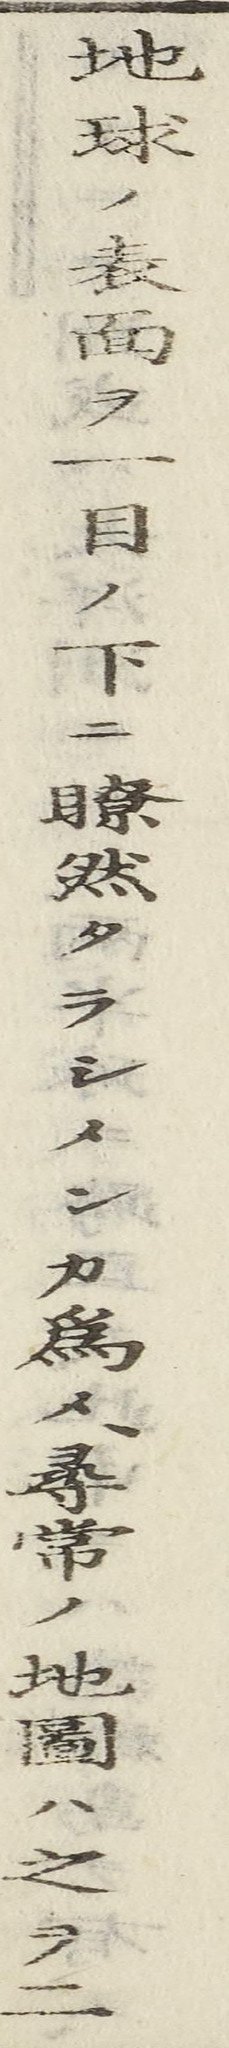地球ノ表面ヲ一目ノ下ニ瞭然タラシメンカ為メ、尋常ノ地図ハ之ヲ二
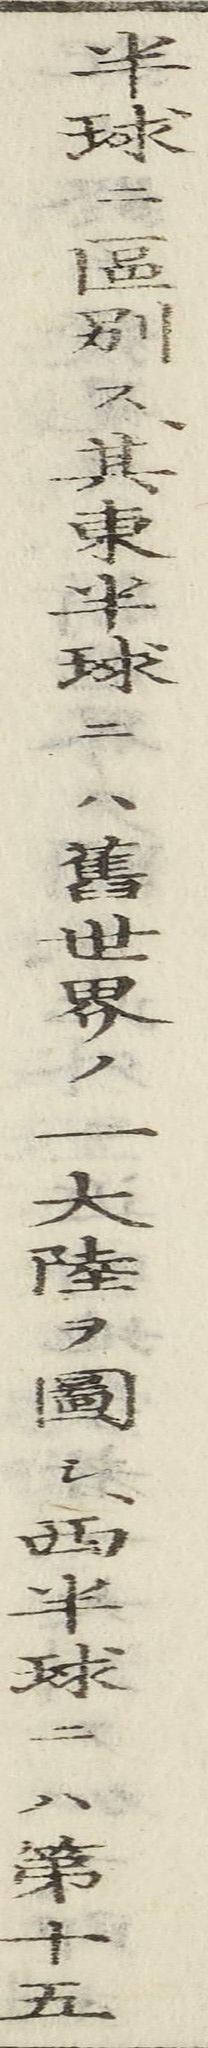半球ニ区別ス、其東半球ニハ旧世界ノ一大陸ヲ図シ、西半球ニハ第十五
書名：百科全書　地文學　全
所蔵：東京大学地震研究所図書室 Earthquake Research Institute Library, The University of Tokyo, JAPAN
